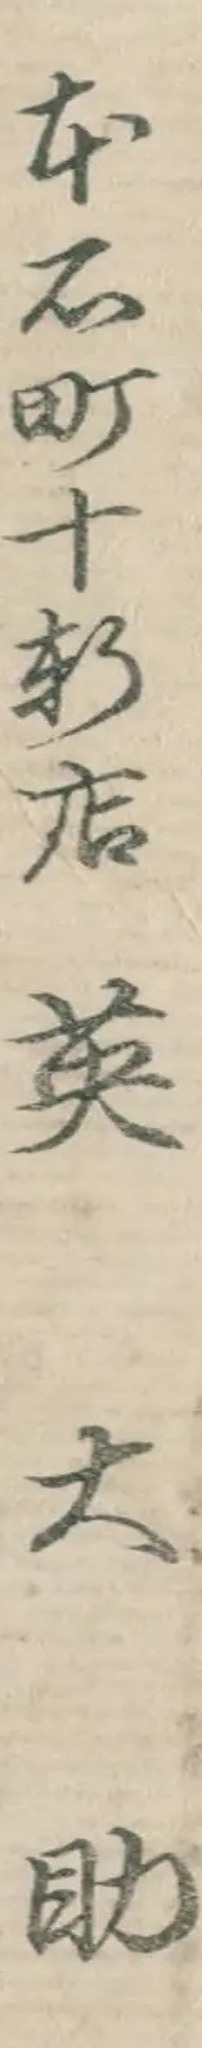本石町十軒店英大助
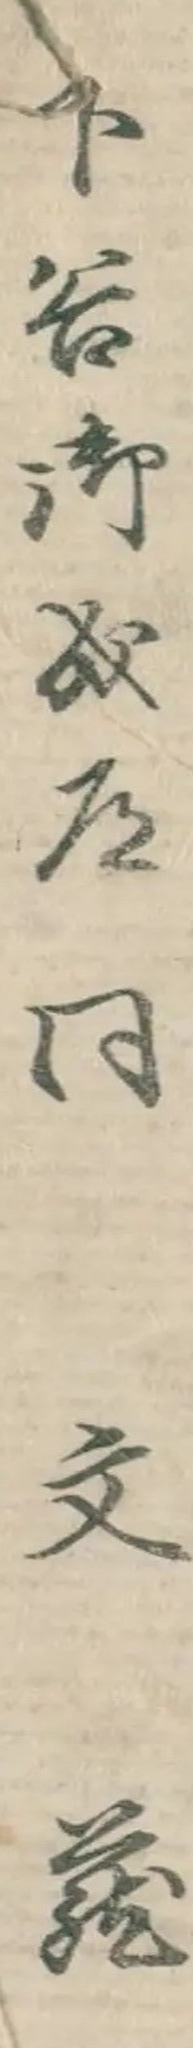下谷御成道同文蔵
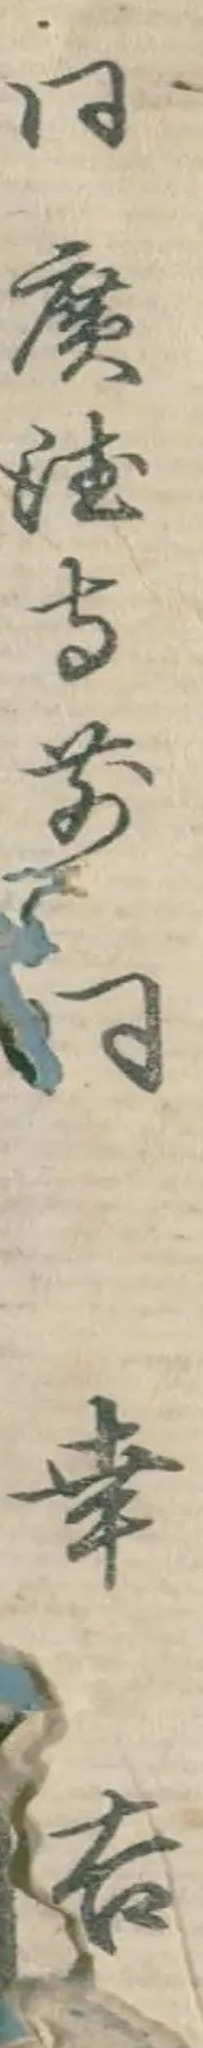同広徳寺前同幸吉
